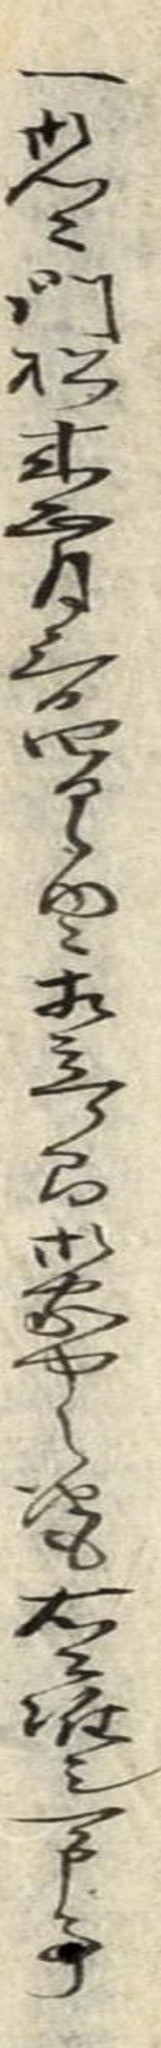一御門々門松来正月三日四日之内に相立候間御家中之儀も右に准シ可申事
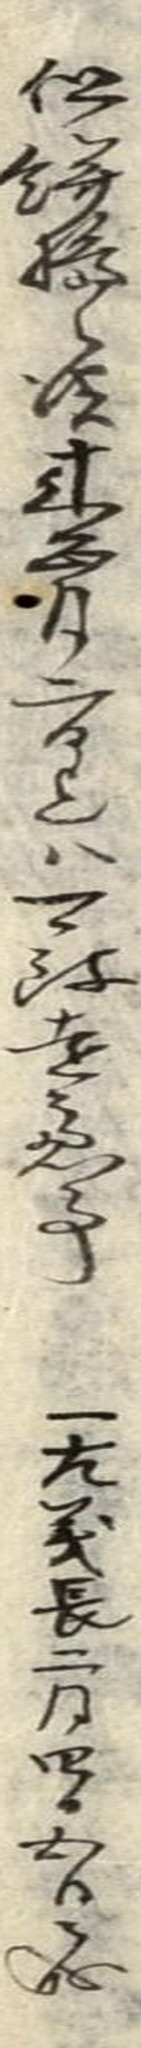但餅搗之儀は来正月二日迄は可致遠慮事一左義長二月四日五日に成
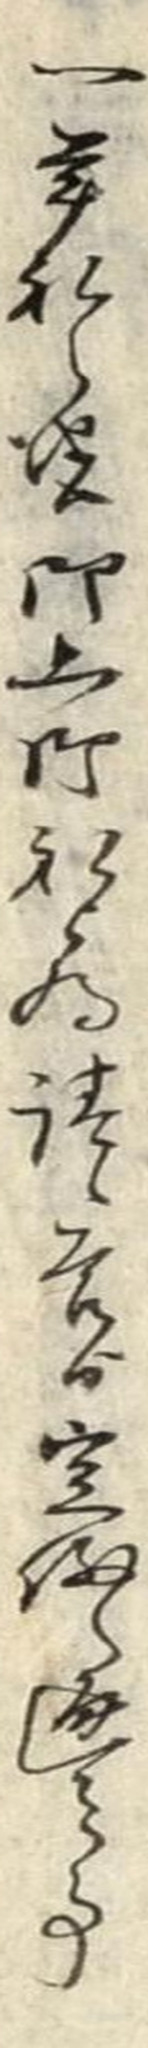一年礼之儀は御上御礼被為請候節ゟ定例之通之事
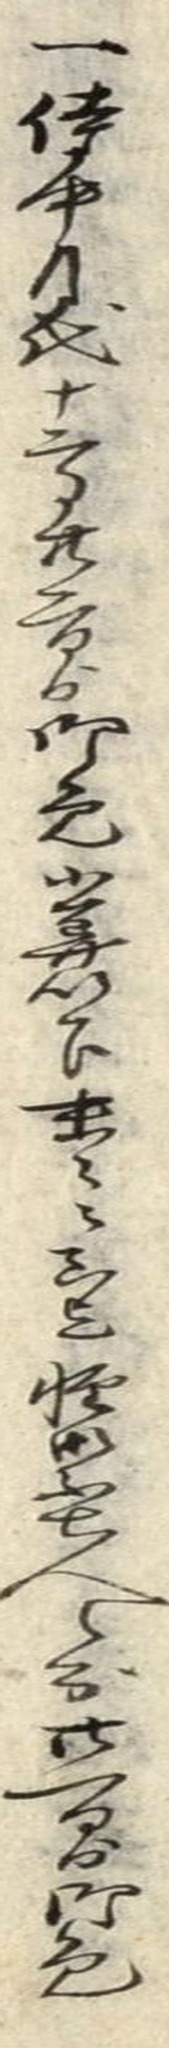一侍中月代十二月廿二日ゟ御免小算以下末々に至迄軽御ふち人之分廿一日ゟ御免
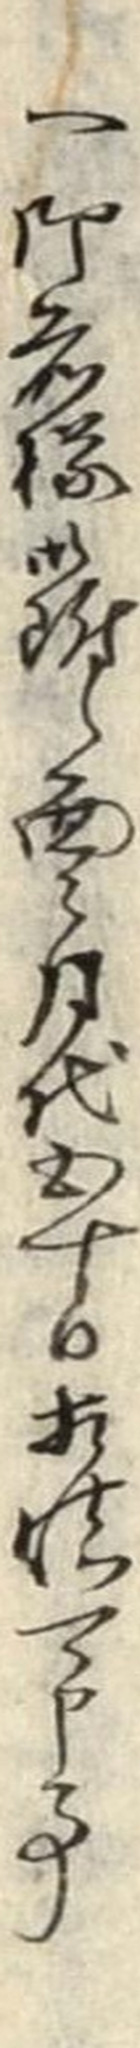一御前様御附之面々月代五十日相慎可申事
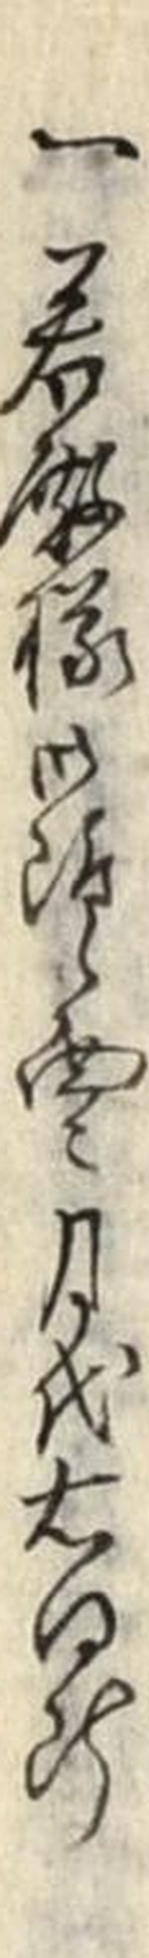一若殿様御附之面々月代右同断
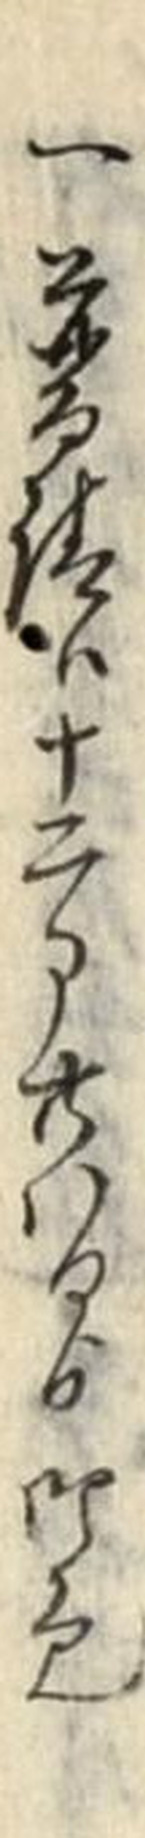一普請は十二月廿八日ゟ御免
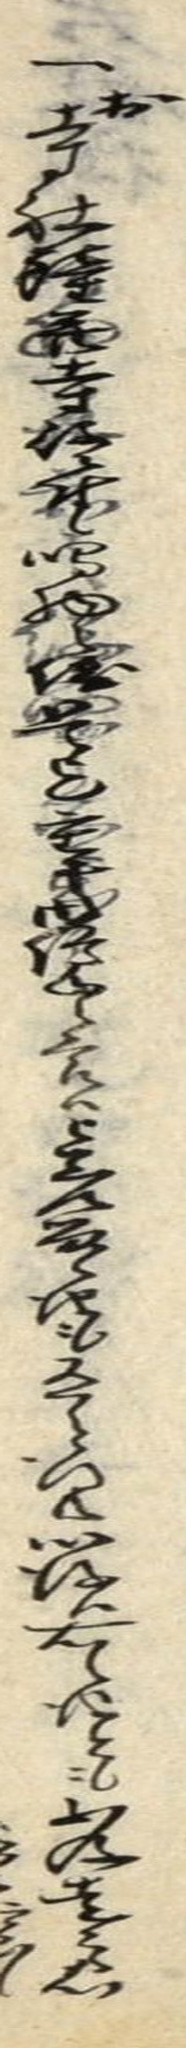一於寺社鐘并寺役に付候鳴物之儀是迄重キ御停止之節は被差留候儀も有之候得共以後は右之儀とも不及遠慮旨被仰出候

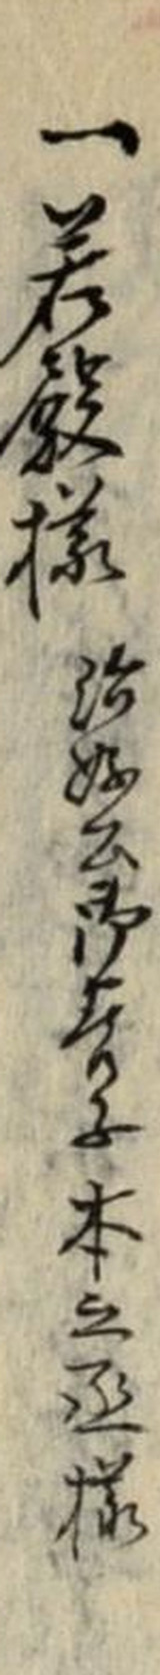一若殿様治好公御養子本之丞様
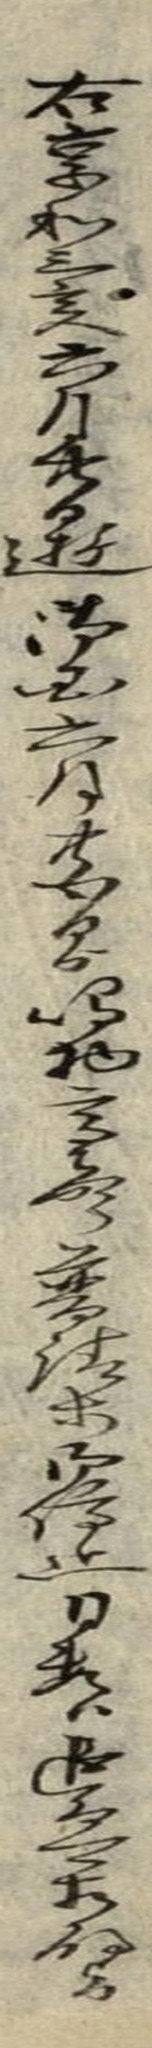右享和三亥六月廿日逝御国六月廿五日ゟ鳴物高声普請等御停止日数は追て可相触旨
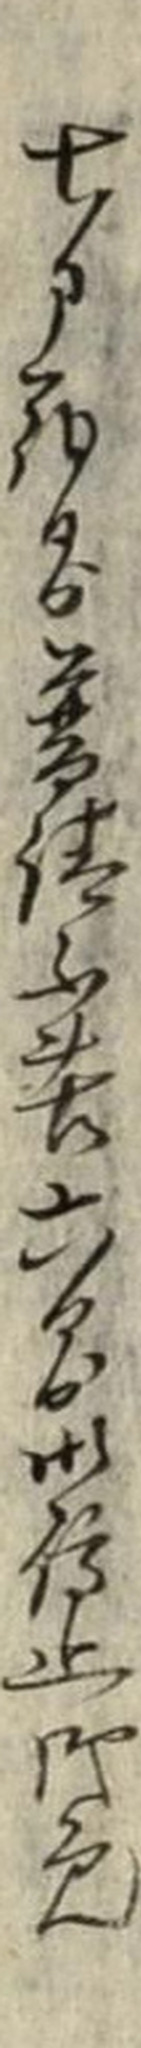七月朔日ゟ普請不苦六日ゟ御停止御免
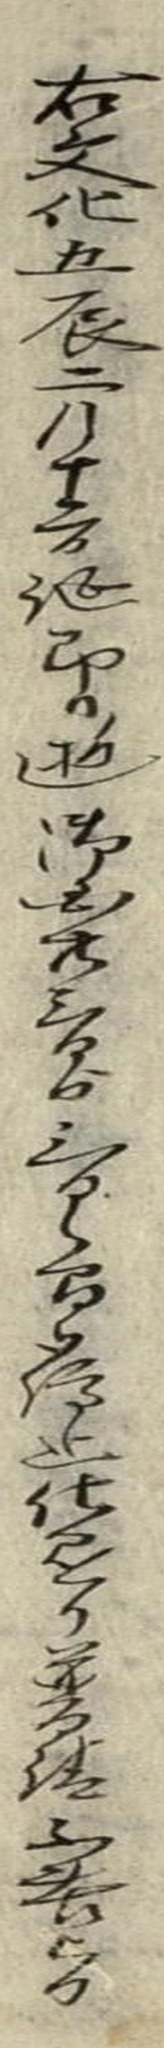右文化五辰二月十二日誕即日逝御国廿三日ゟ三日之間御停止仕懸り普請不苦旨
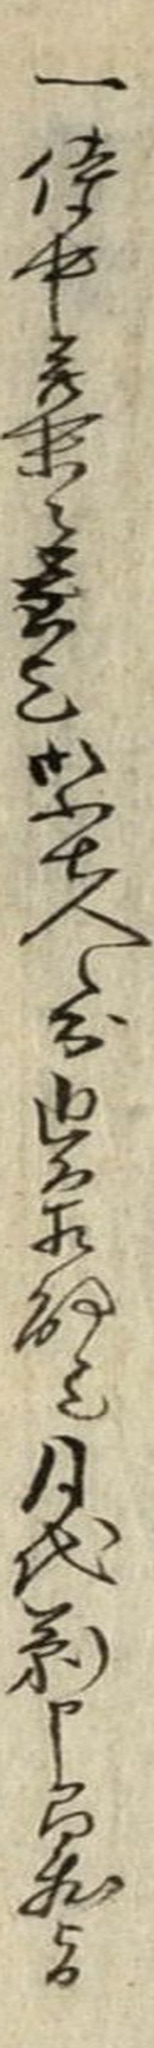一侍中并末々に至迄御ふち人之分追て相触迄月代剃申間敷旨
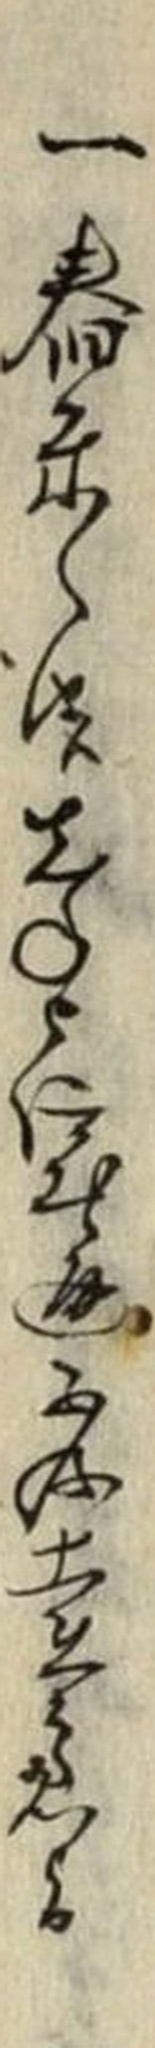一舂米之儀は先年被仰出候通不及遠慮旨
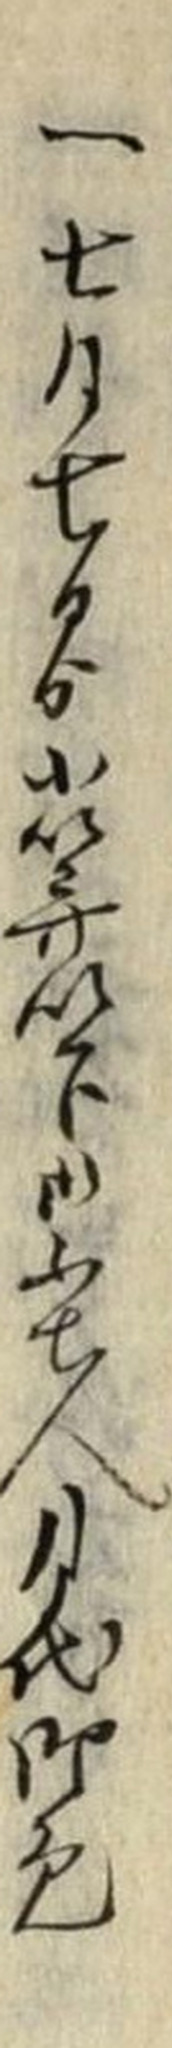一七月七日ゟ小算以下御ふち人月代御免
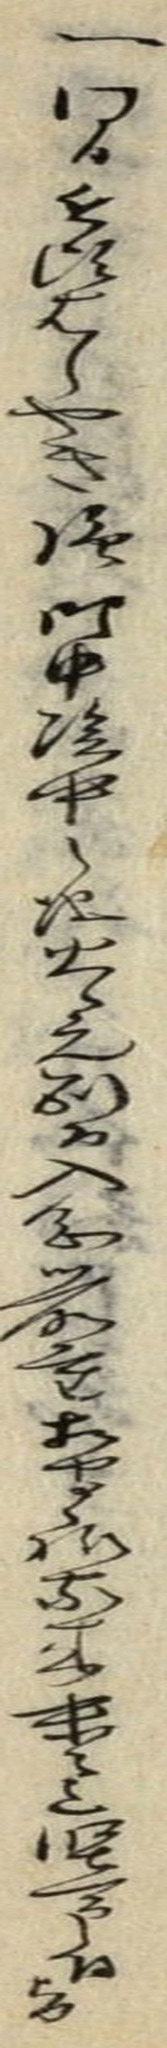一同日近頃はしやき強御中陰中之儀火之元別て入念厳重相守候様家来末々迄堅可申付旨
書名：御停止異変死失
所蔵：福井県文書館 Fukui Prefectural Archives
